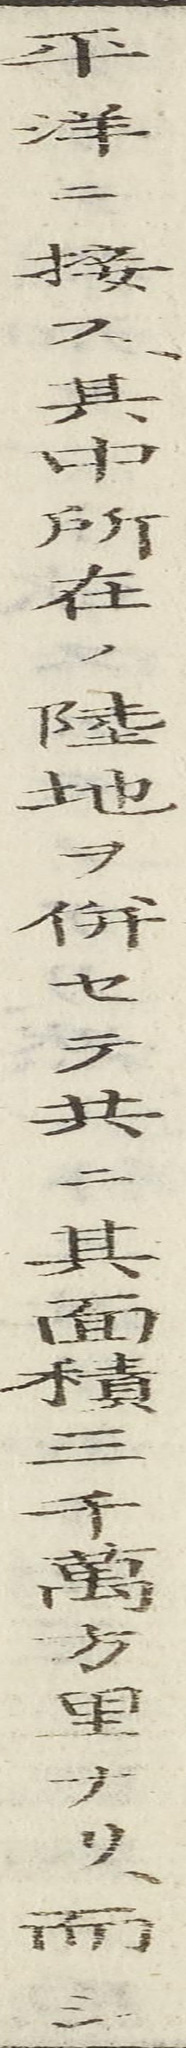平洋ニ接ス、其中所在ノ陸地ヲ、併セテ共ニ其面積三千万方里ナリ、而シ
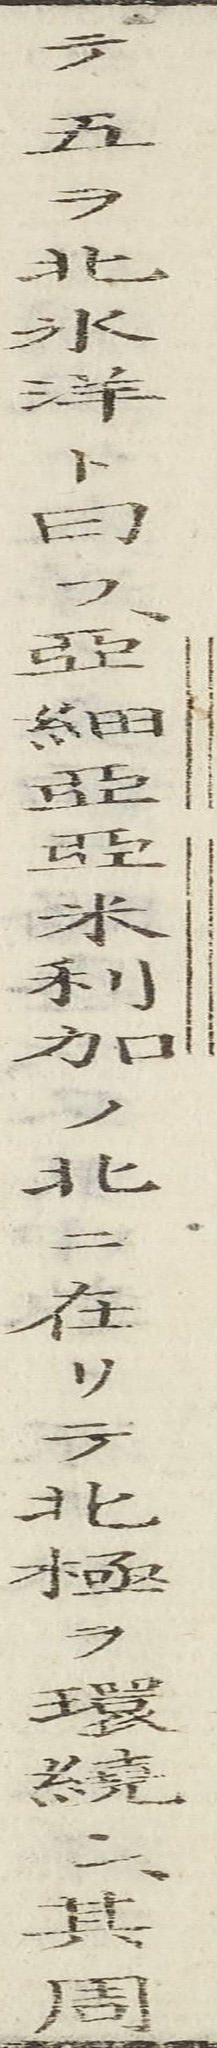テ五ヲ北氷洋ト曰フ、亜細亜亜米利加ノ北ニ在リテ北極ヲ還繞シ、其周
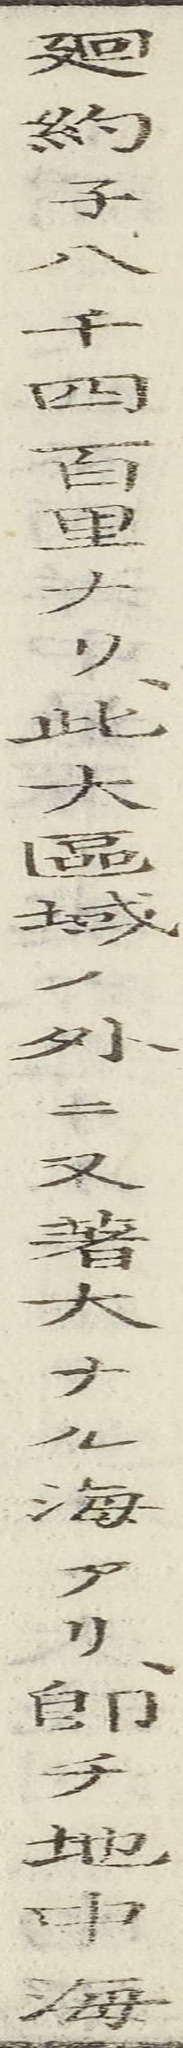廻約ネ八千四百里ナリ、此大区域ノ外ニ又著大ナル海アリ、即チ地中海
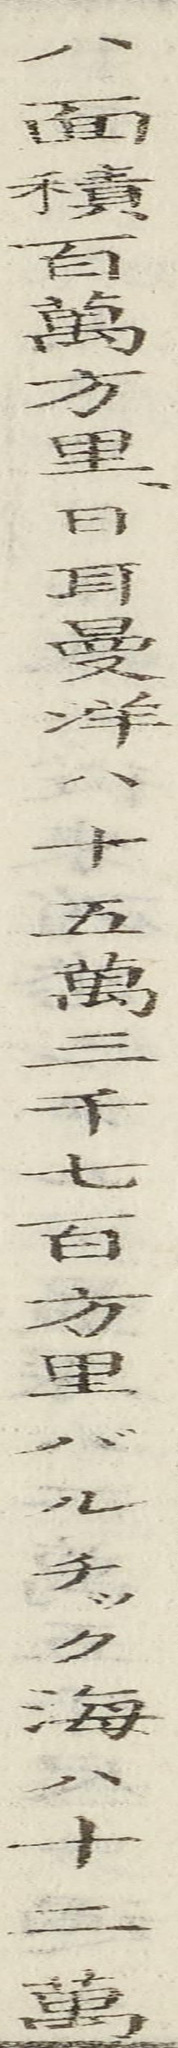ハ面積百万方里、日耳曼洋ハ十五万三千七百方里バルチック海ハ十二万
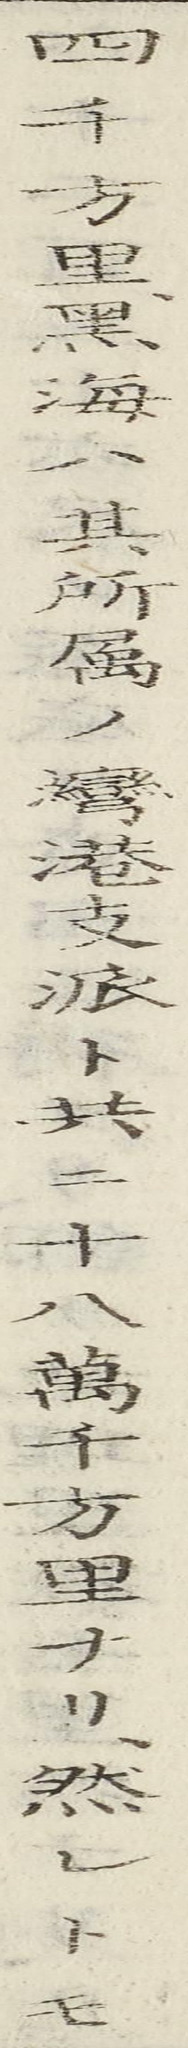四千方里、黒海ハ其所属ノ湾港支脈ト共ニ十八万千方里ナリ、然レトモ
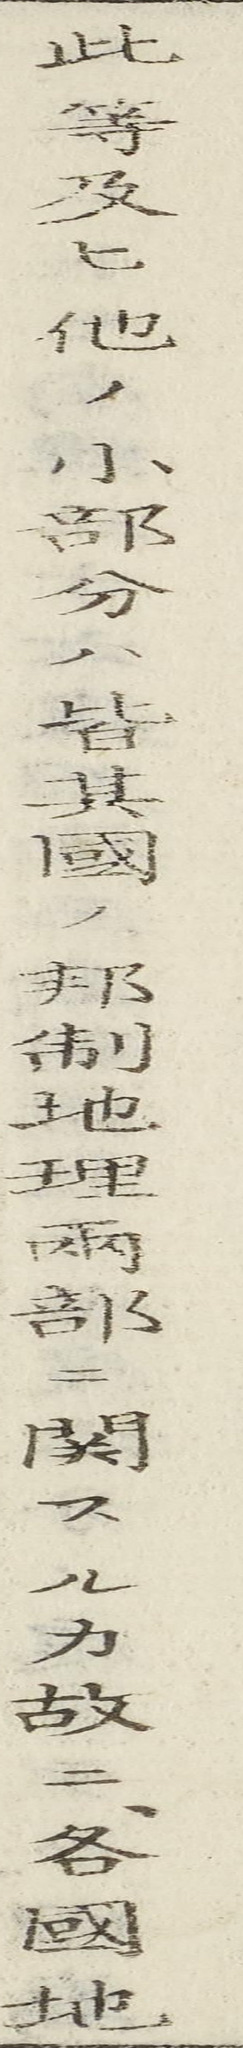此等及ヒ他ノ小部分ハ皆其国ノ邦制地理両部ニ関スルカ故ニ、各国地
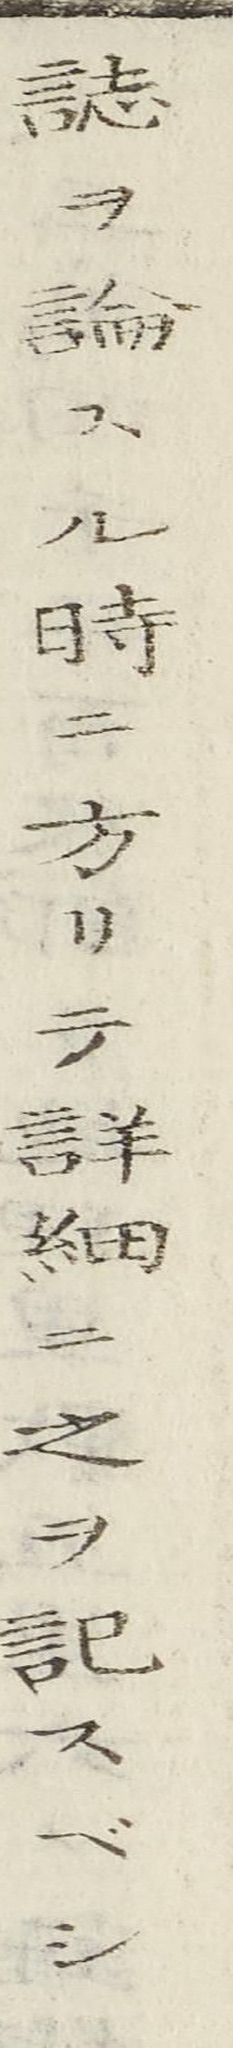誌ヲ論スル時ニ方リテ詳細ニ之ヲ記スベシ
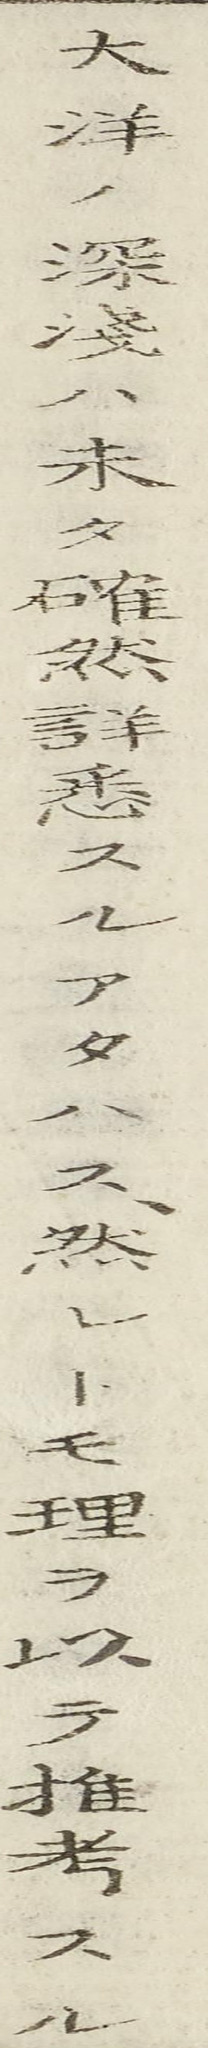大洋ノ深浅ハ未タ確然詳悉スルアタハス、然レトモ理ヲ以テ推考スル
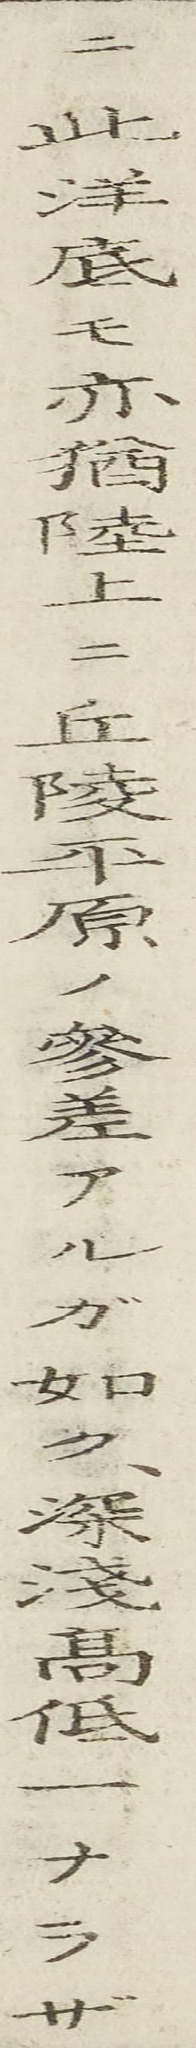ニ此洋底モ亦猶陸土ニ丘陵平原ノ参差アルガ如ク、深浅高低一ナラザ
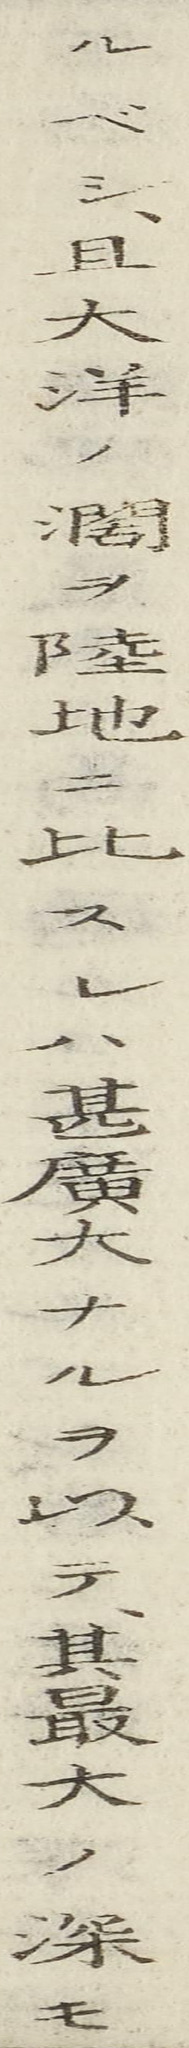ルベシ、且大洋ノ濶ヲ陸地ニ比スレハ甚広大ナルヲ以テ、其最大ノ深モ

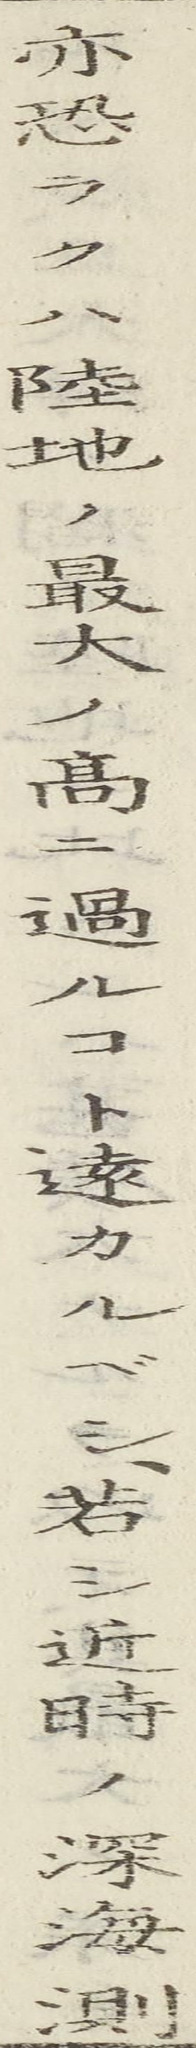亦恐ラクハ陸地ノ最大ノ高ニ過ルコト遠カルベシ、若シ近時ノ深海測
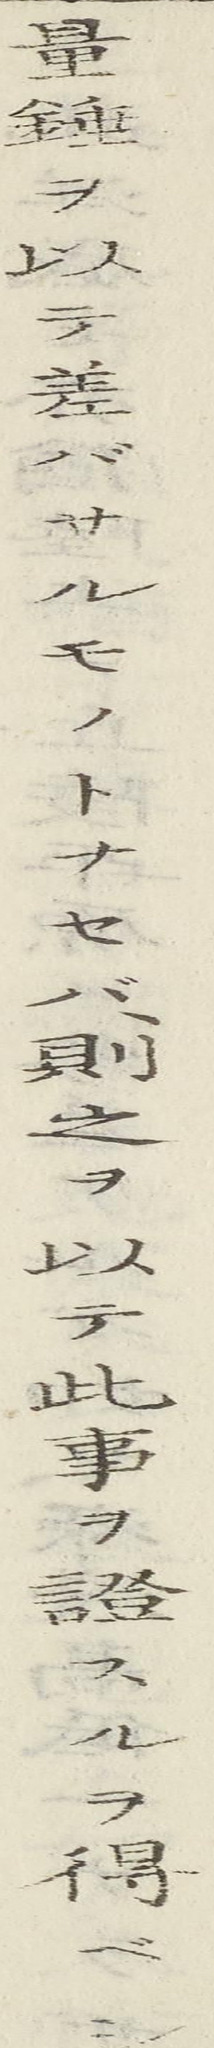量錘ヲ以テ差バサルモノトナセバ、則之ヲ以テ此事ヲ証スルヲ得ベシ、
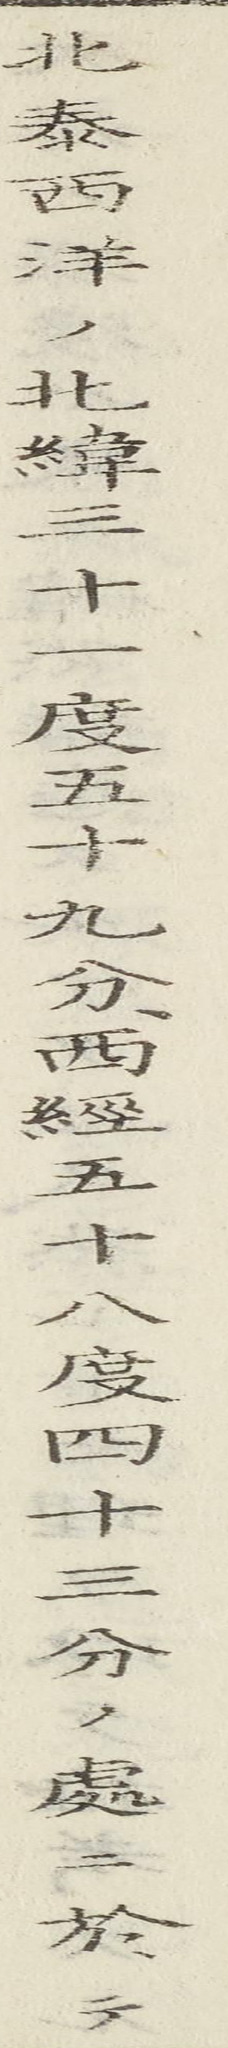北泰西洋ノ北緯三十一度五十九分、西経五十八度四十三分ノ処ニ於テ
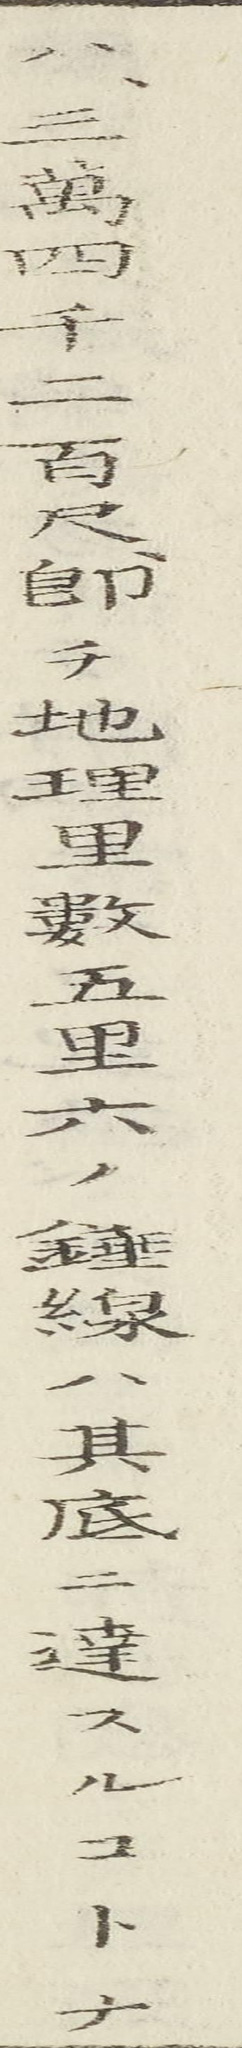ハ、三万四千二百尺、即チ地理里数五里六ノ錘線ハ其底ニ達スルコトナ
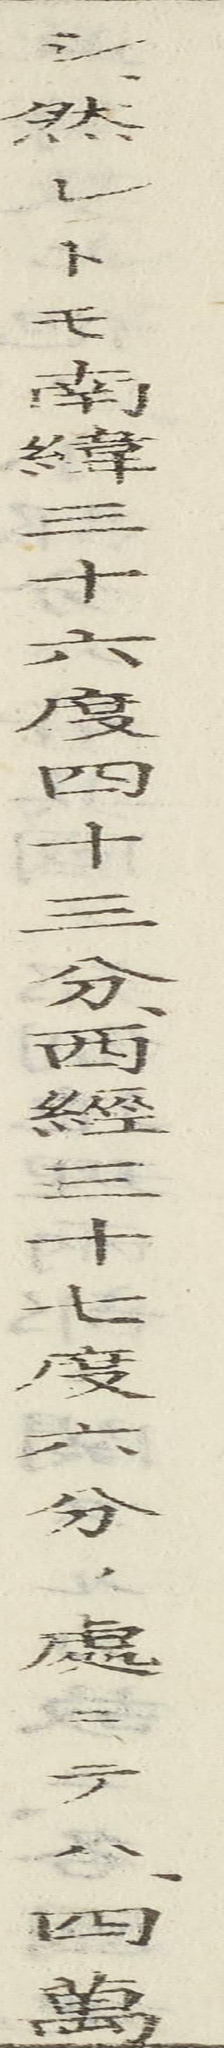シ、然レトモ南緯三十六度四十三分、西経三十七度六分ノ処ニテハ、四万
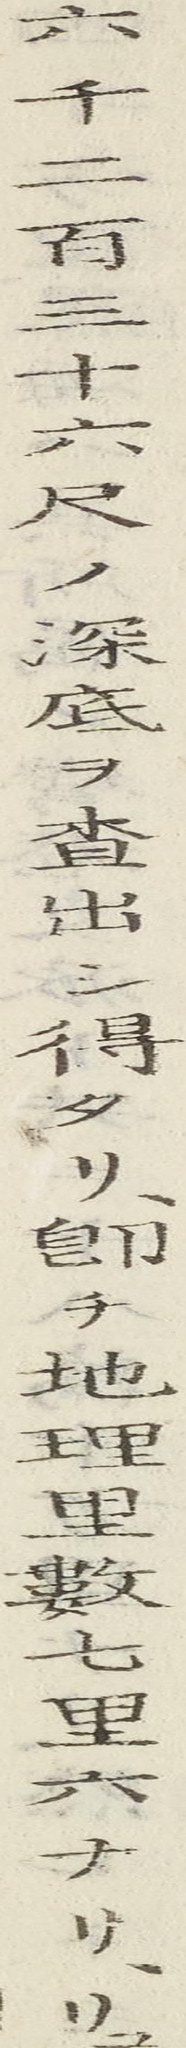六千二百三十六尺ノ深底ヲ査出シ得タリ、即チ地理里数七里六ナリ、リュ
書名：百科全書　地文學　全
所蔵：東京大学地震研究所図書室 Earthquake Research Institute Library, The University of Tokyo, JAPAN
